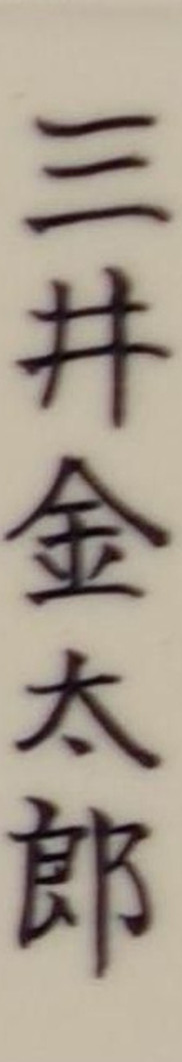三井金太郎
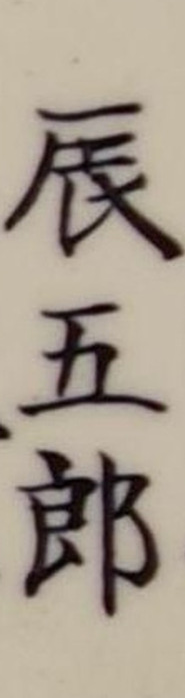辰五郎
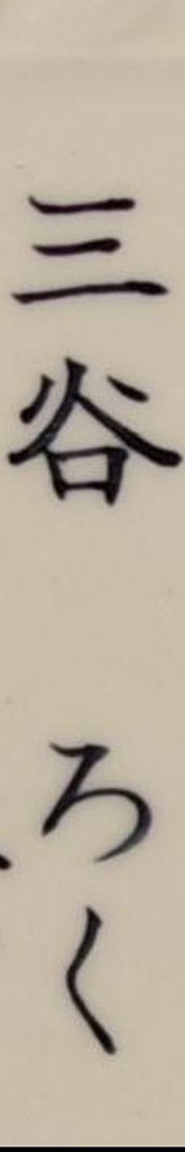三谷ろく
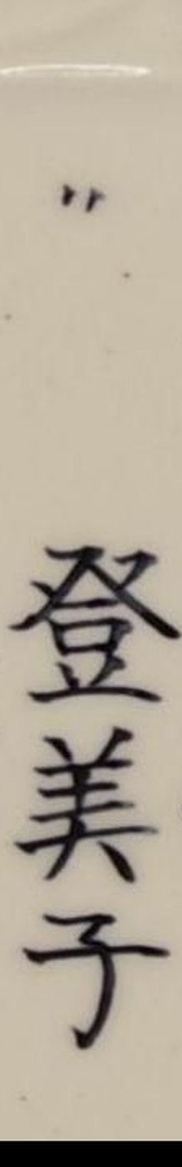登美子
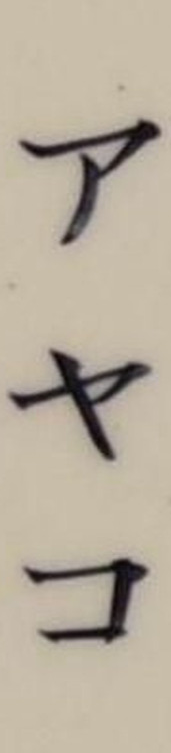アヤコ

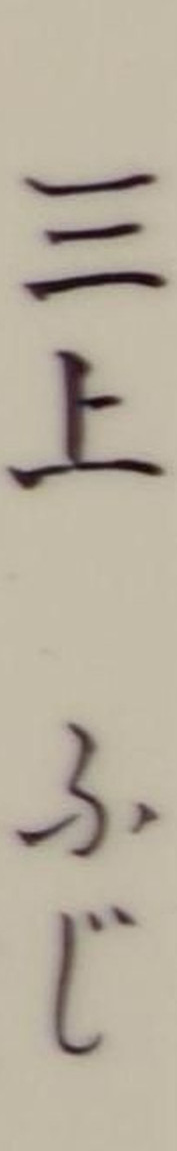三上ふじ
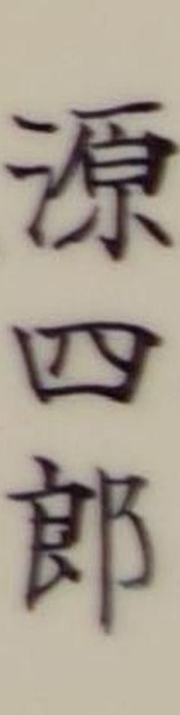源四郎
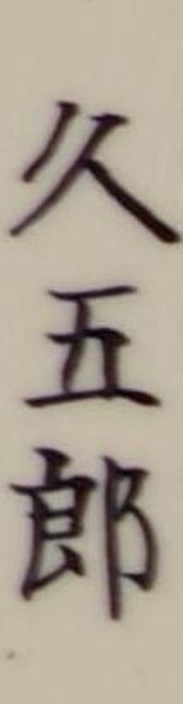久五郎
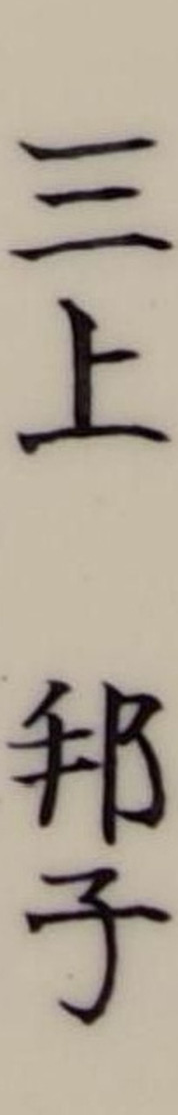三上邦子
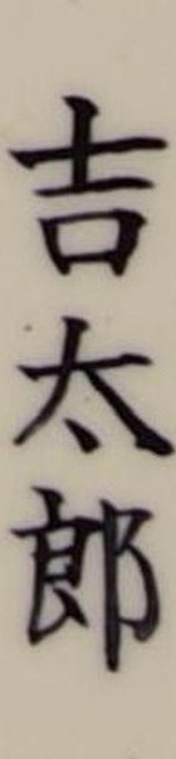吉太郎
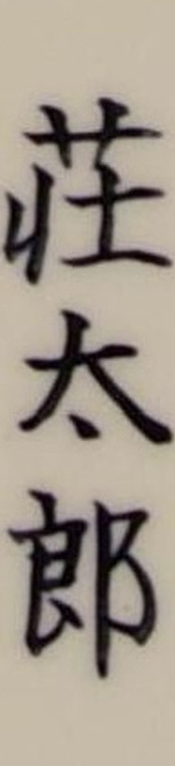荘太郎
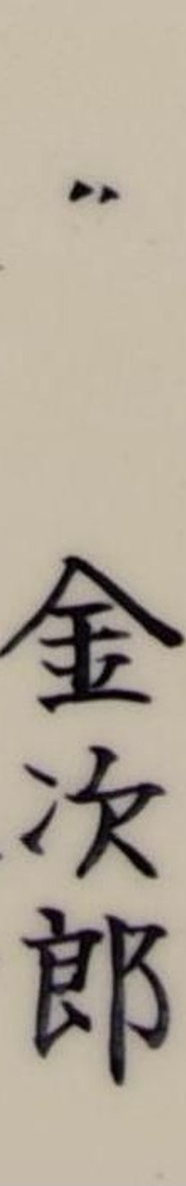金次郎
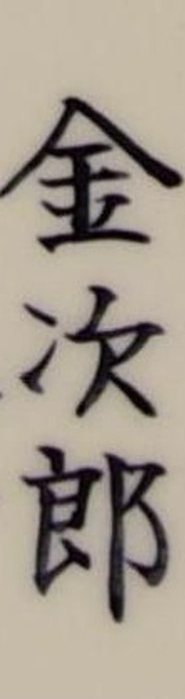金次郎
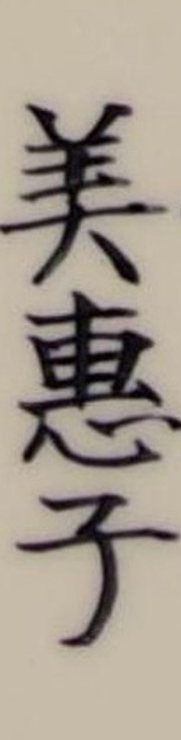美恵子
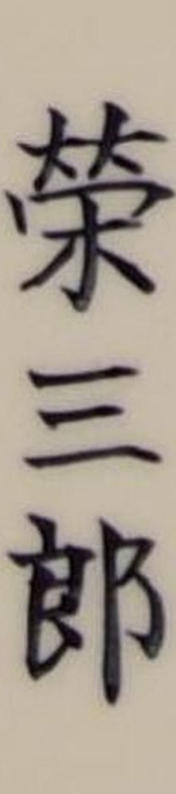榮三郎
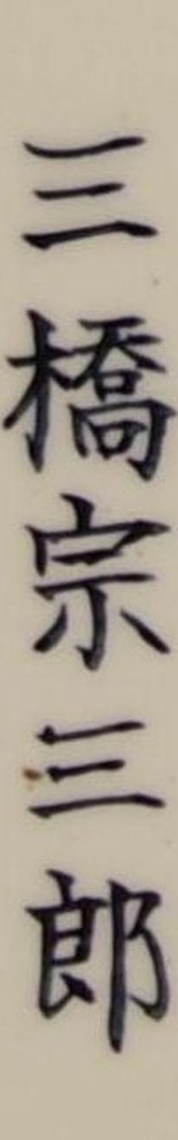三橋宗三郎
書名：E~L
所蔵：高野山金剛峯寺
